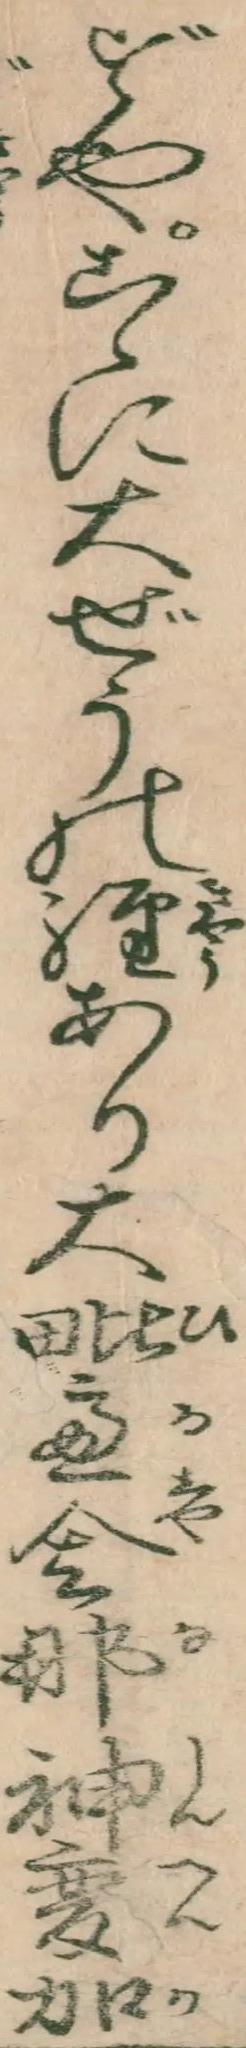ずや。こゝに大ぜうの経あり大毘盧舎那神変加
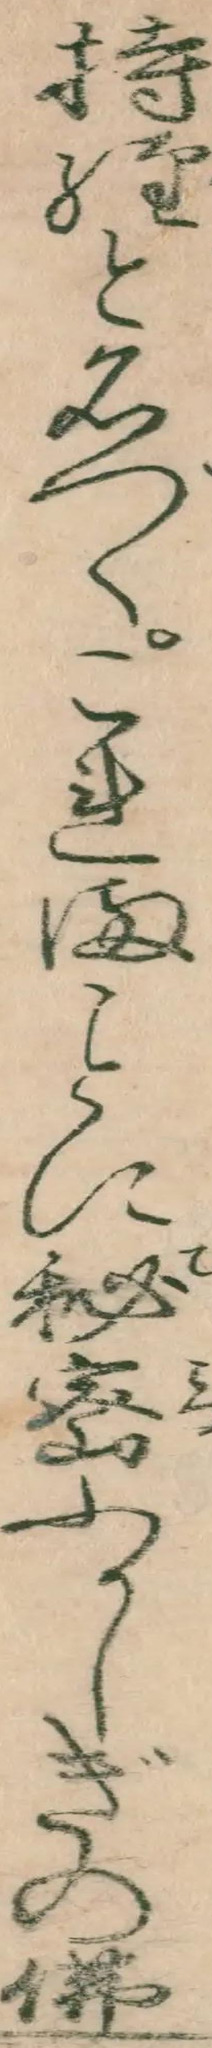持経と名づく。これまことに秘密ふかしぎの仏
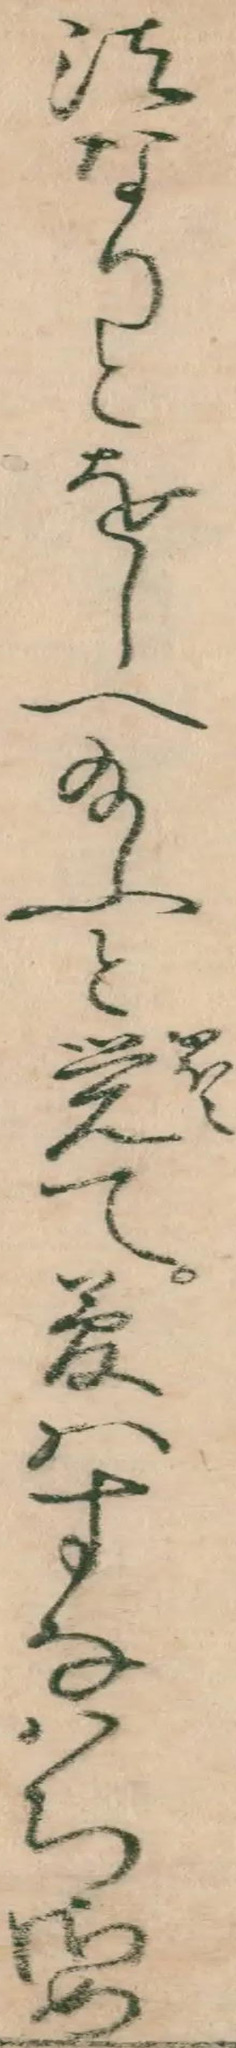法なりとをしへ給ふと覚て。夢はすなはちさめ
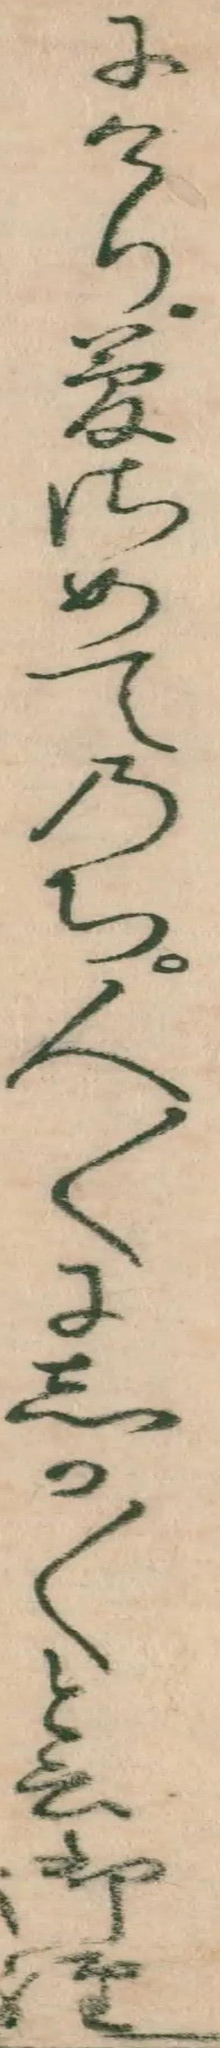にけり。夢さめてのち。人〳〵はしか〳〵と云御経
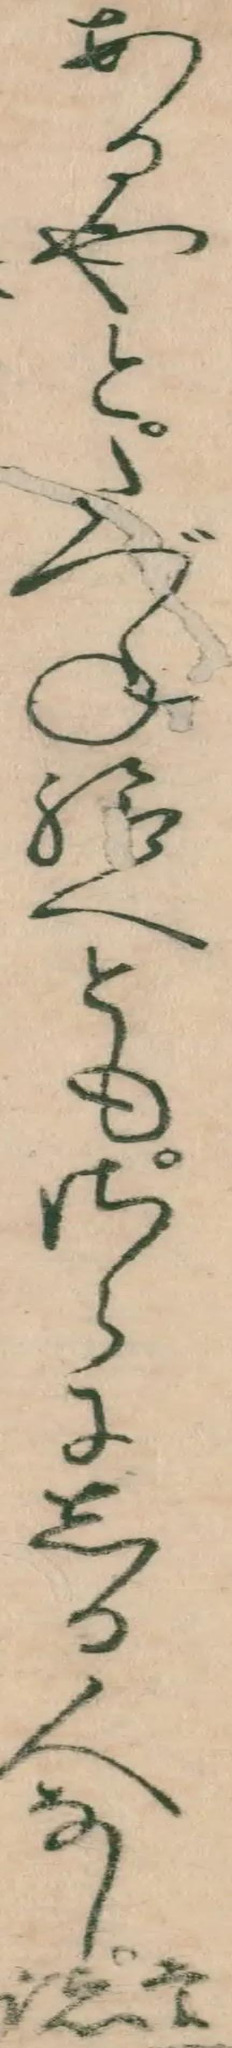あるやと。たづね給へとも。さらにしる人なし。諸
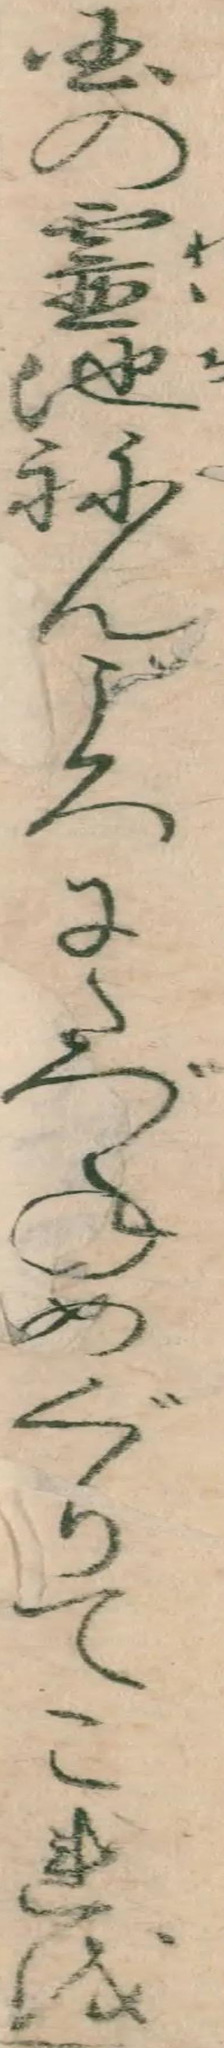国の霊地ねんごろにたづねめぐりてこれを
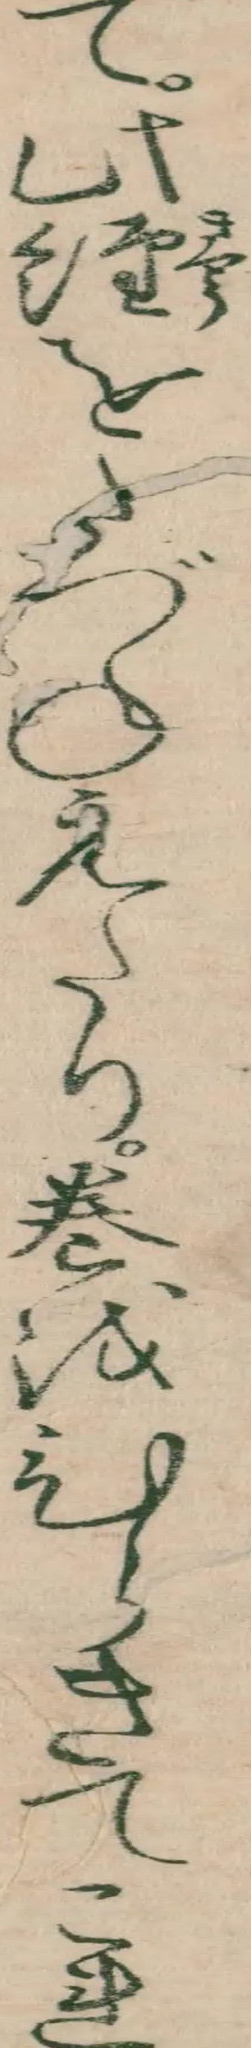て。此経をたづねえたり。巻をひらきてこれ
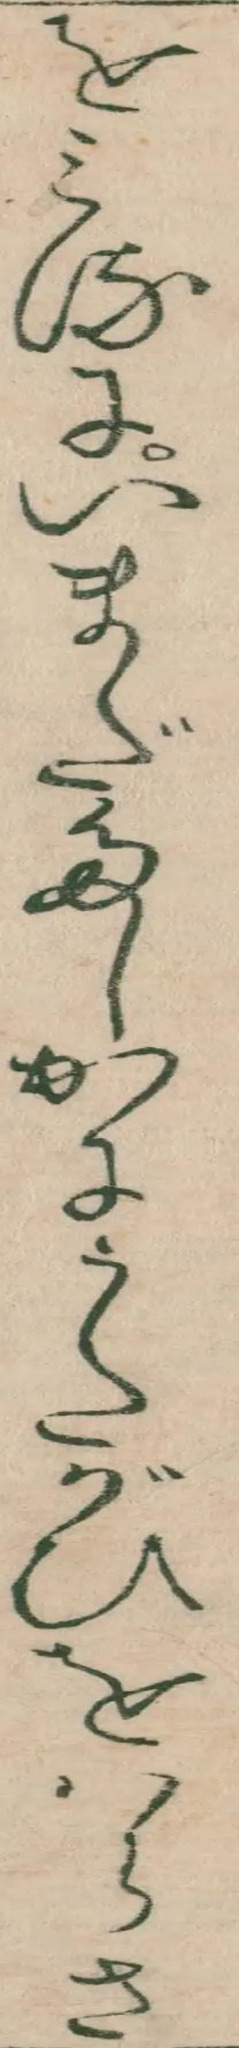をみるに。いまだたしかにうたがひをはらさ
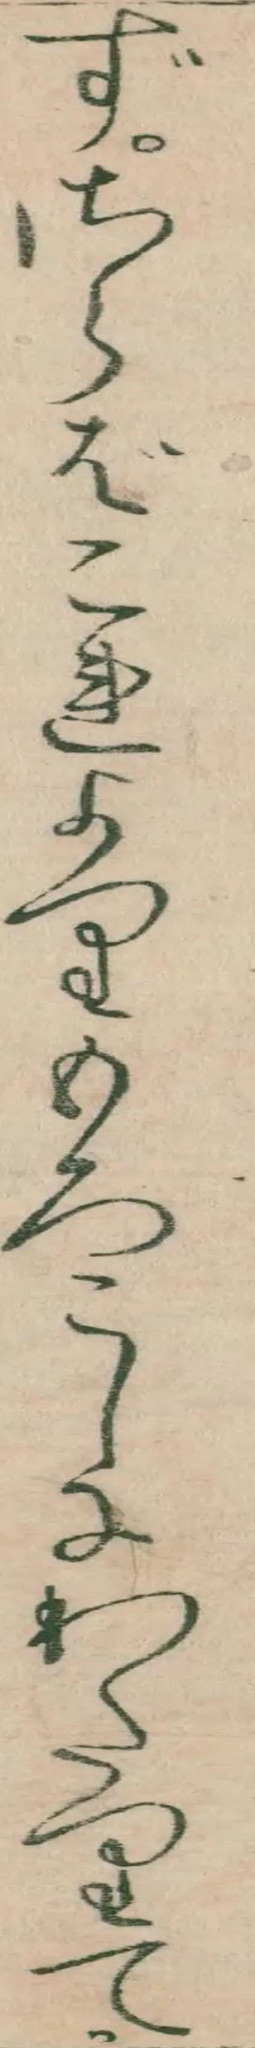ず。さらばこれよりもろこしにわたりて。
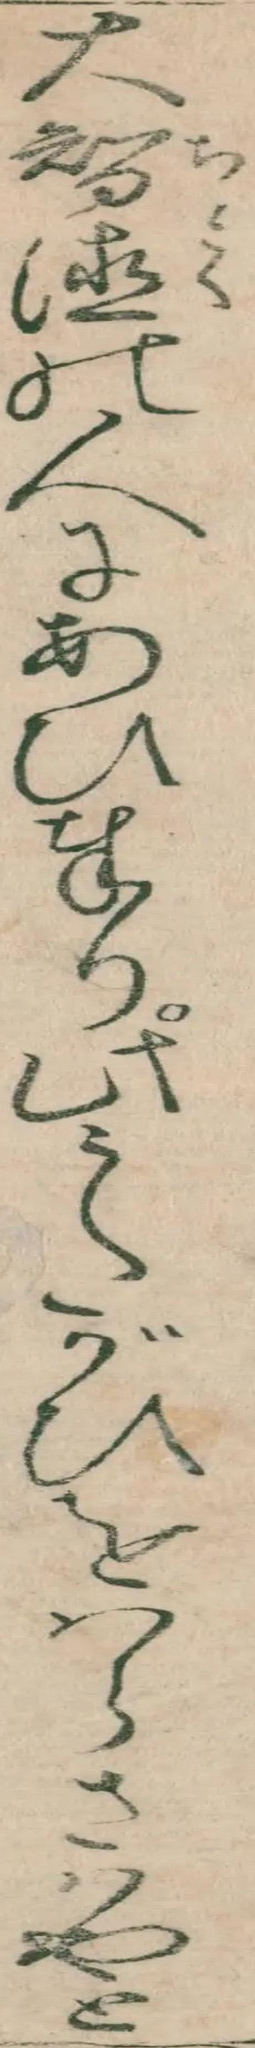大智徳の人にあひ奉り。此うたがひをはらさはやと
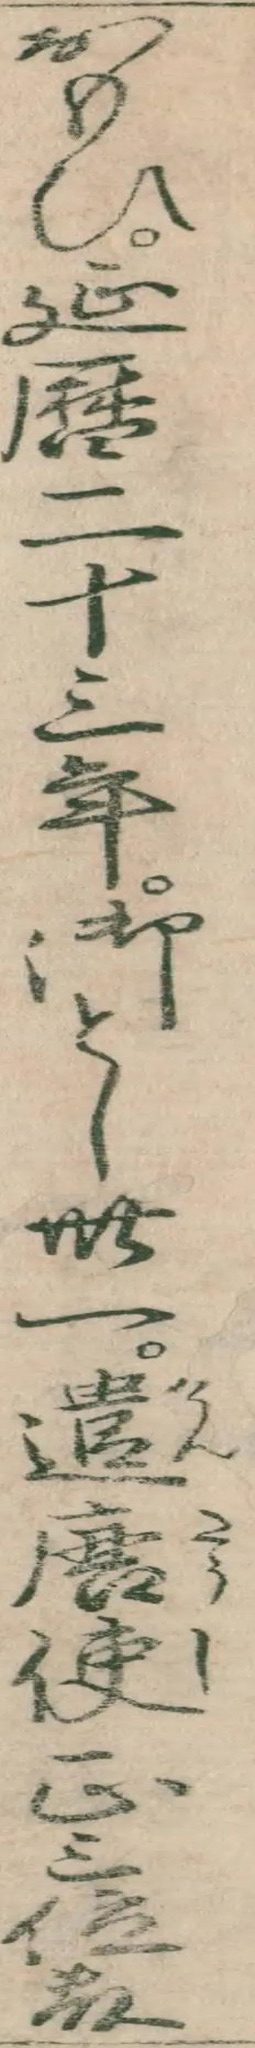おもひ。延暦二十三年。御とし卅一。遣唐使正三位藤
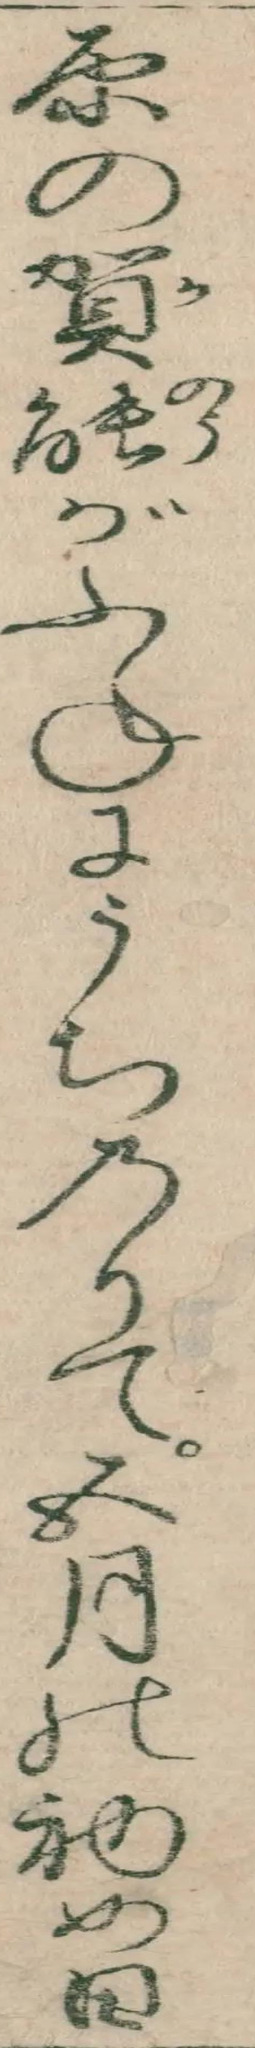原の加能がふねにうちのりて。五月の初め日
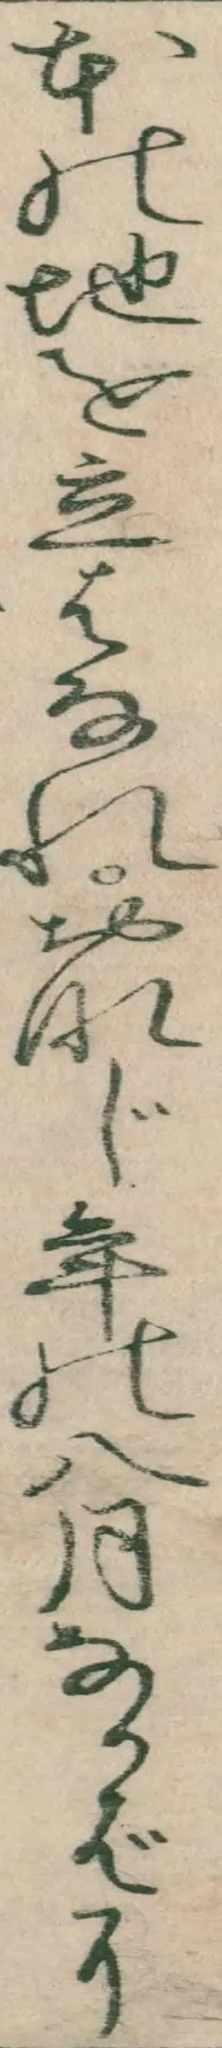本の地を立はなれ。おなじ年の八月なかばに
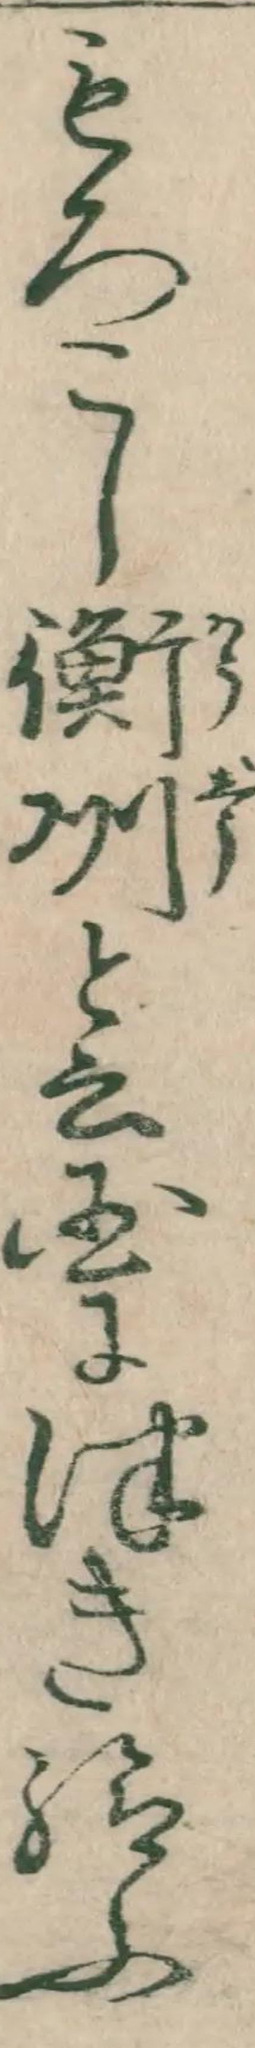もろこし衝州と云国につき給ふ

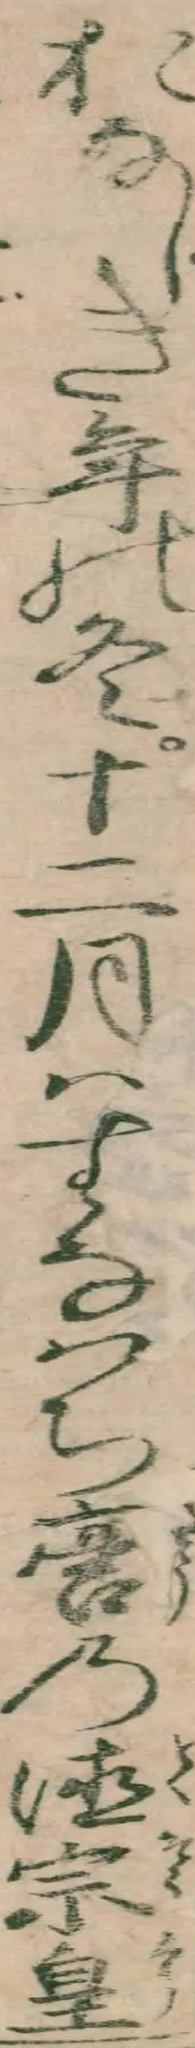おなじき年の冬。十二月はすなはち唐の徳宗皇
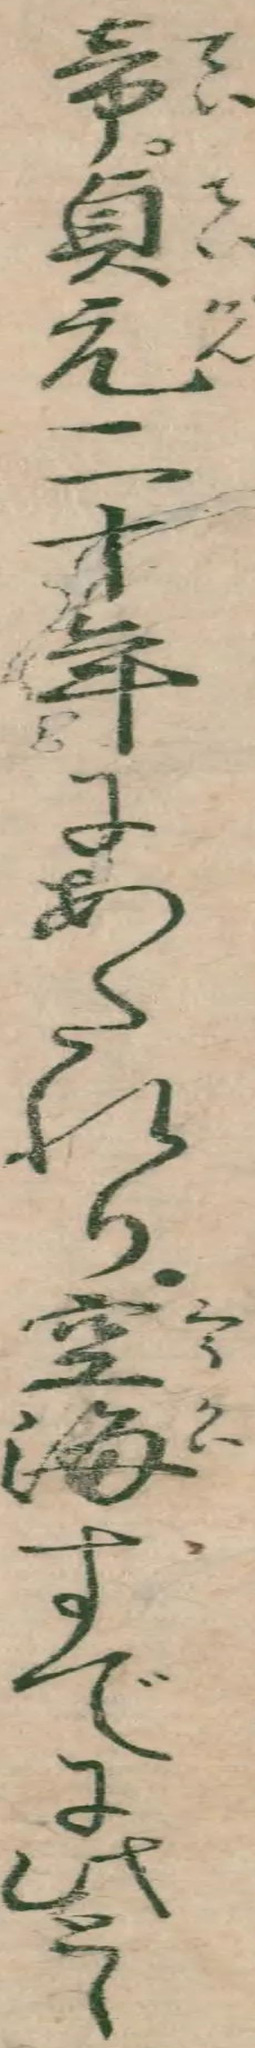帝。貞元二十年にあたれり。空海すでに此とし
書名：弘法大師御本地 3巻. [1]
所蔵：国立国会図書館 National Diet Library, JAPAN
